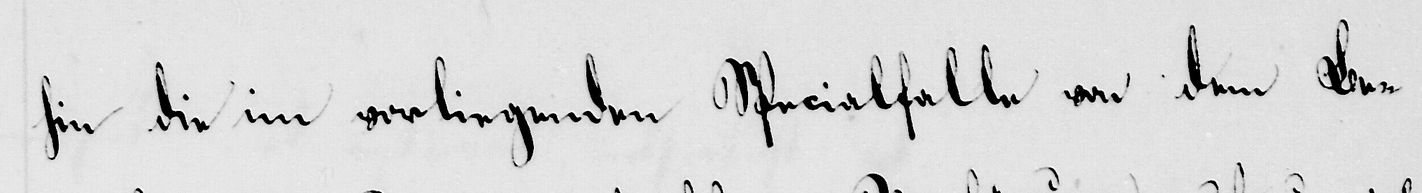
hin die im vorliegenden Specialfalle von dem Be¬
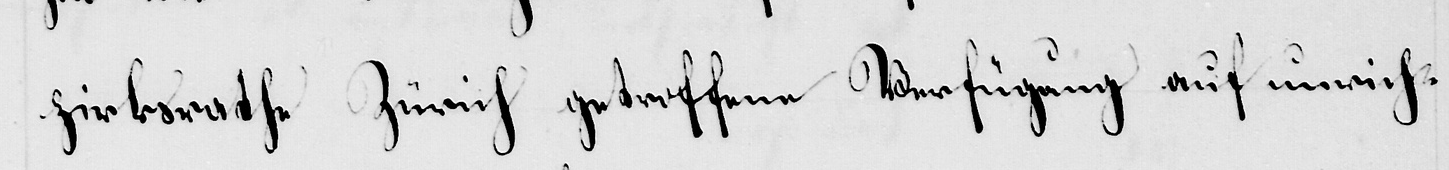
zirksrathe Zürich getroffene Verfügung auf unrich¬
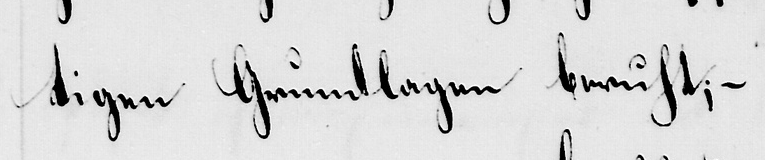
tigen Grundlagen beruht; –
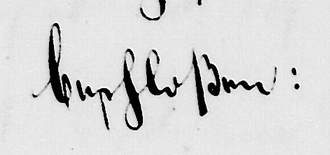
beschlossen:
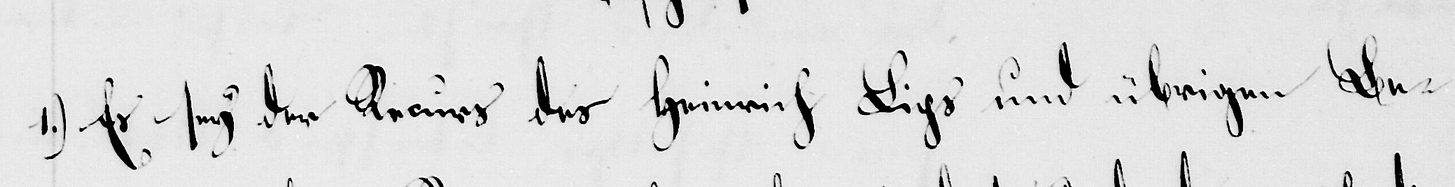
1.) Es sey der Recurs des Heinrich Lips und übrigen Be¬
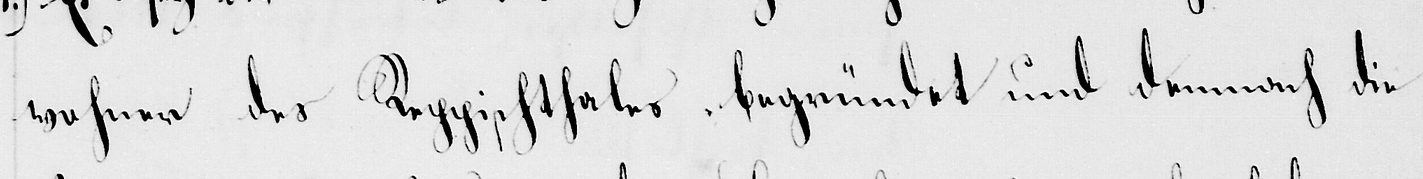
wohner des Reppischthales begründet und demnach die
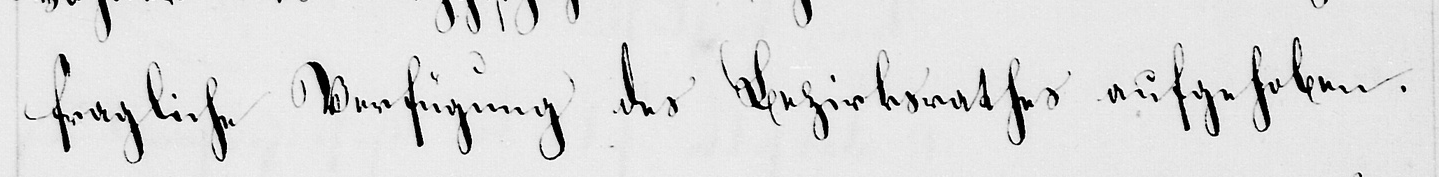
fragliche Verfügung des Bezirksrathes aufgehoben.
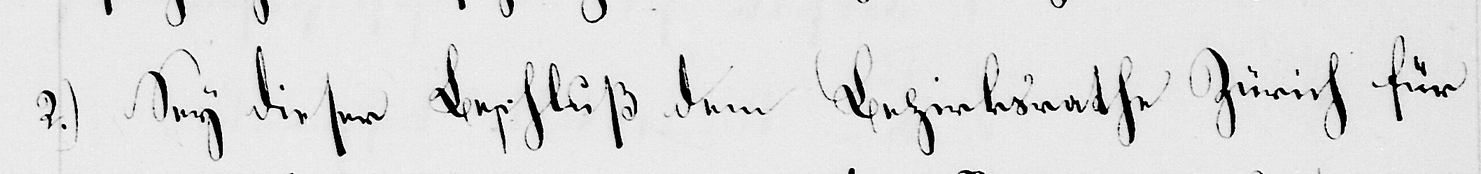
2.) Sey dieser Beschluß dem Bezirksrathe Zürich für
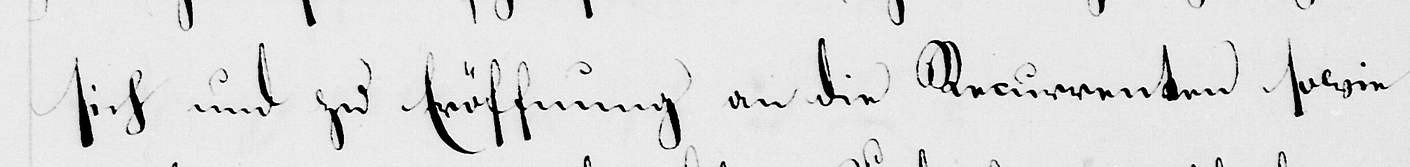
sich und zu Eröffnung an die Recurrenten sowie
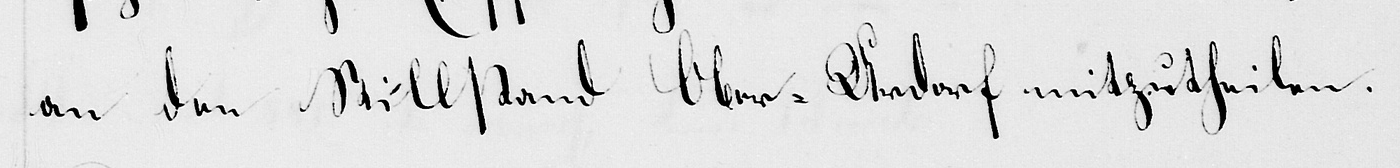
an den Stillstand Ober-Urdorf mitzutheilen.
